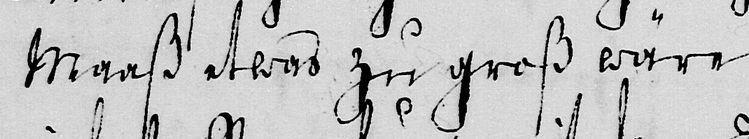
Maaß etwas zu groß wäre
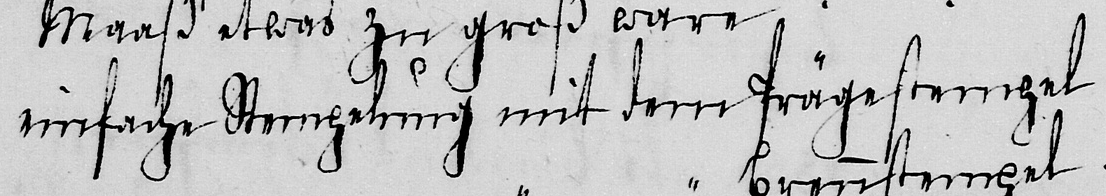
einfache Stempelung mit dem Prägestempel
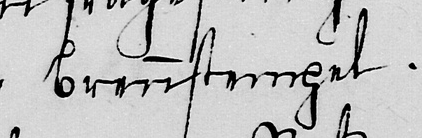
Brennstempel
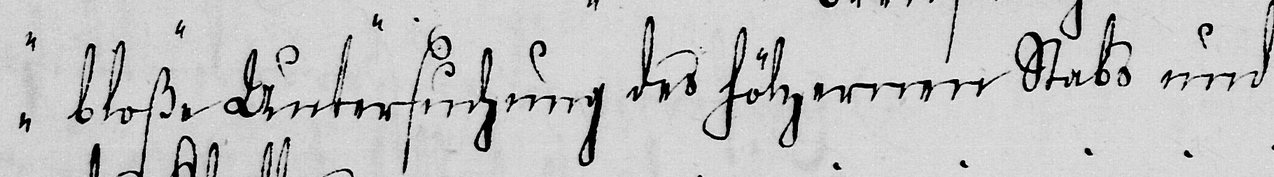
bloße Untersuchung des hölzernen Stabs und
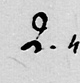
2.
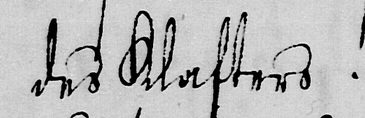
des Klafters
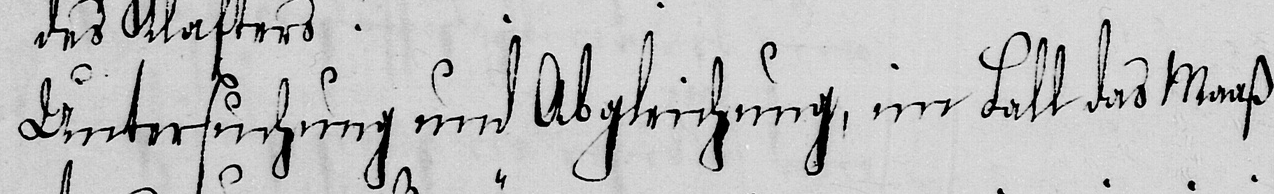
Untersuchung und Abgleichung, im Fall das Maaß
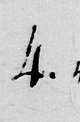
4.
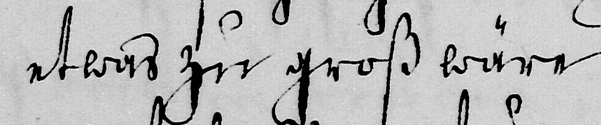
etwas zu groß wäre
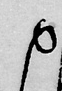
4.
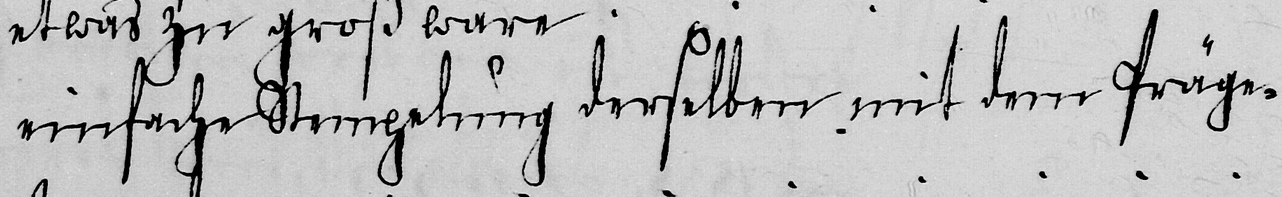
einfache Stempelung derselben mit dem Präge¬
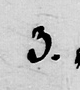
3.
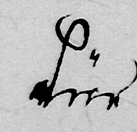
Für
